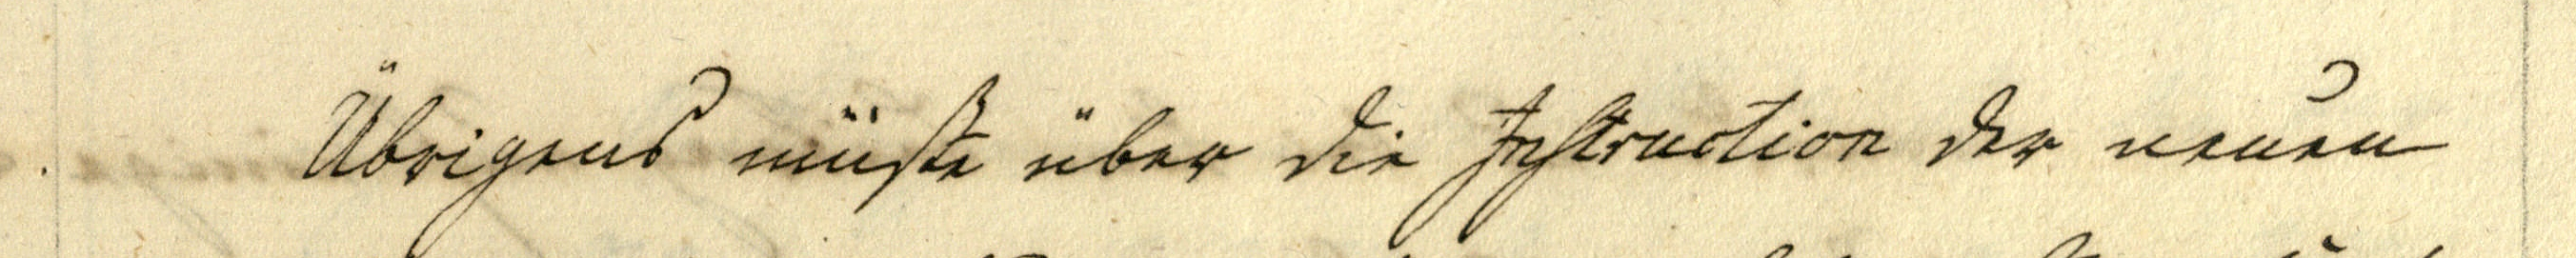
Übrigens müßte über die Instruction der neuen
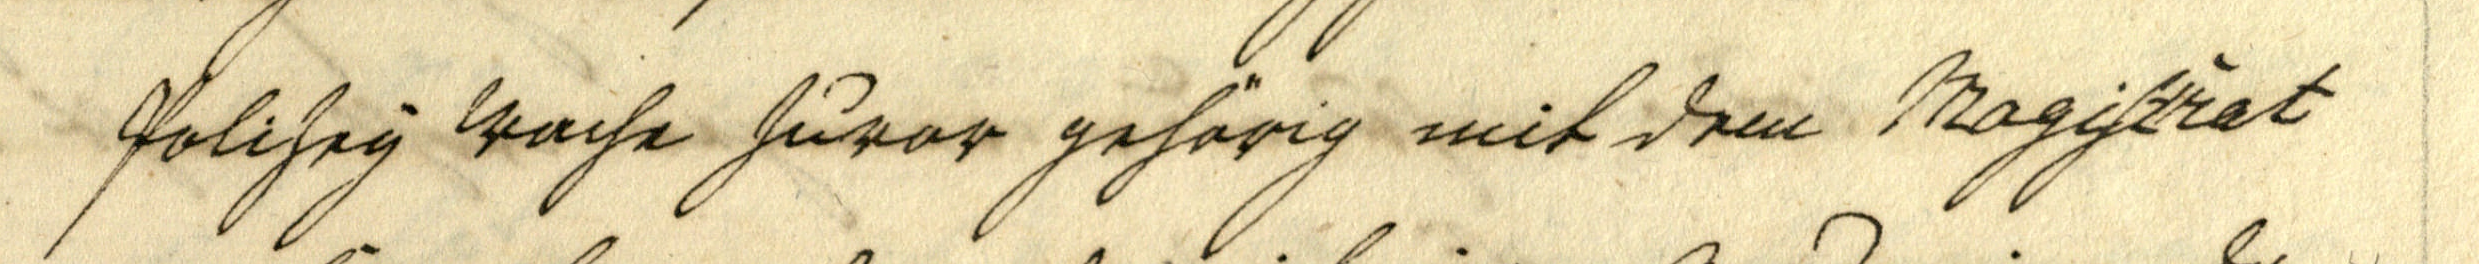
Polizey Wache zuvor gehörig mit dem Magistrat
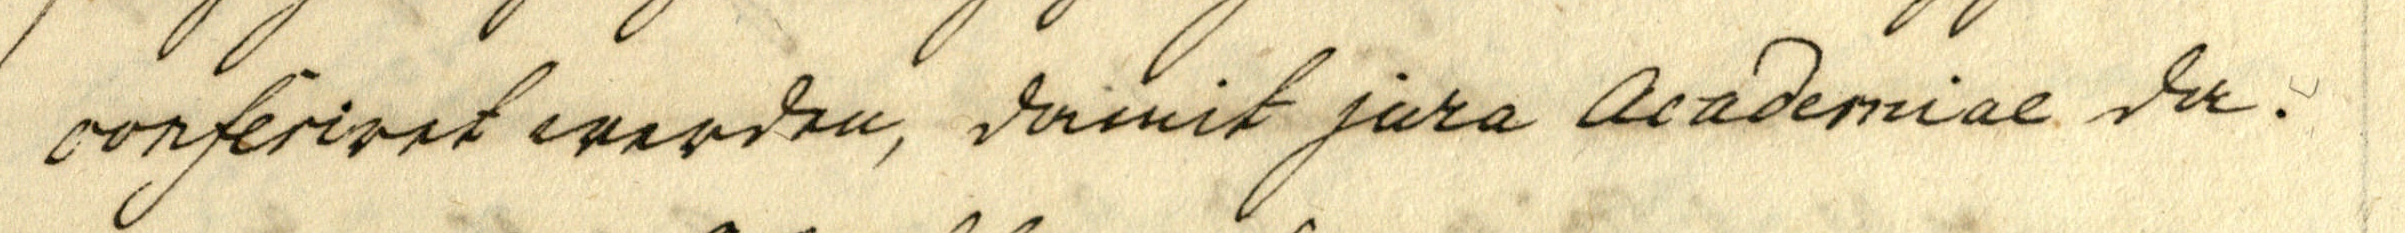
conferiret werden, damit jura Academiae da-
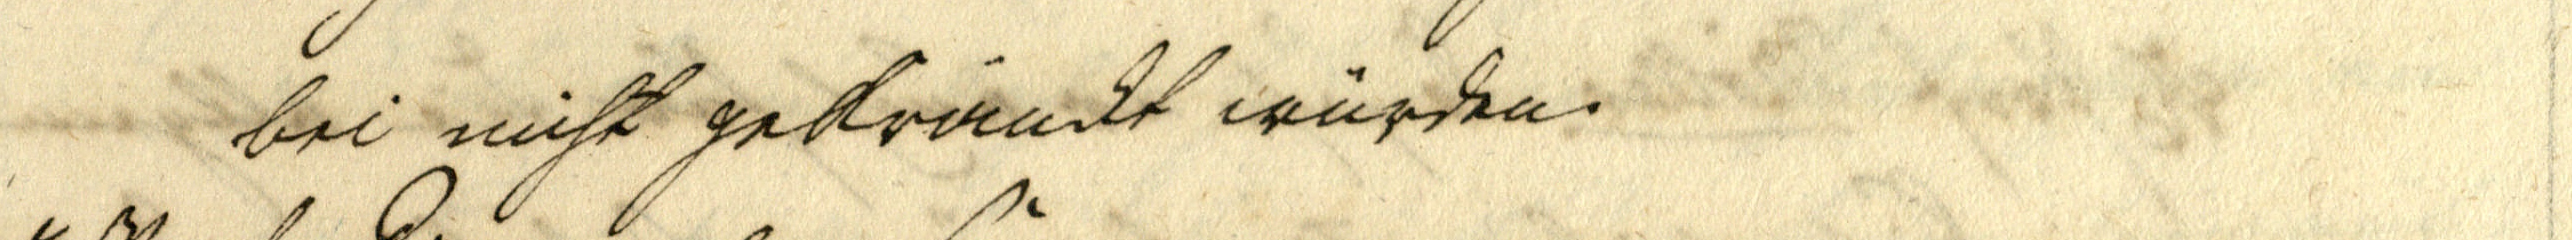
bei nicht gekränkt würden.
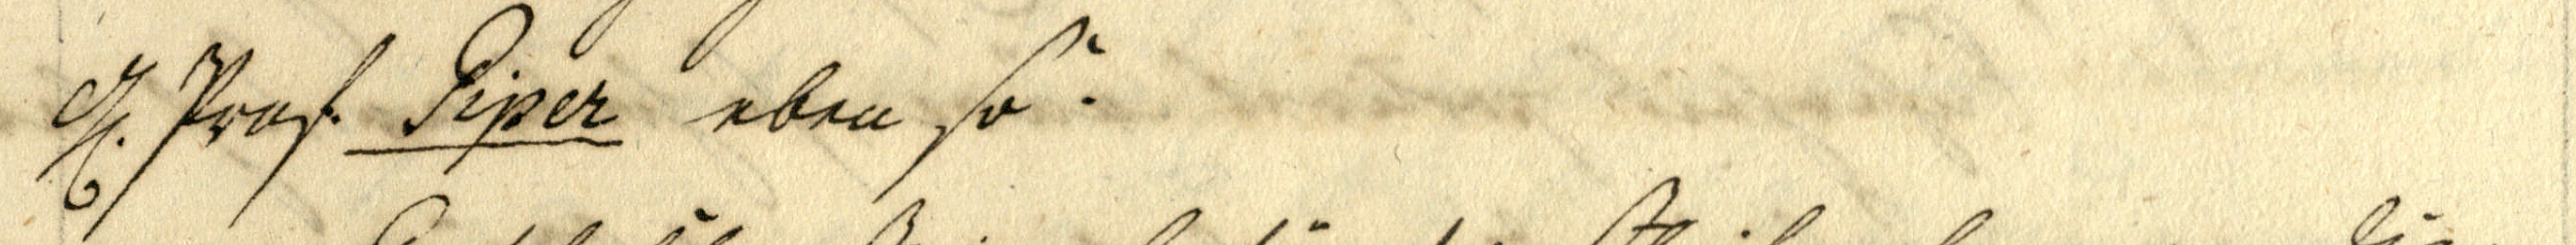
dh. Prof. Piper ebenso.
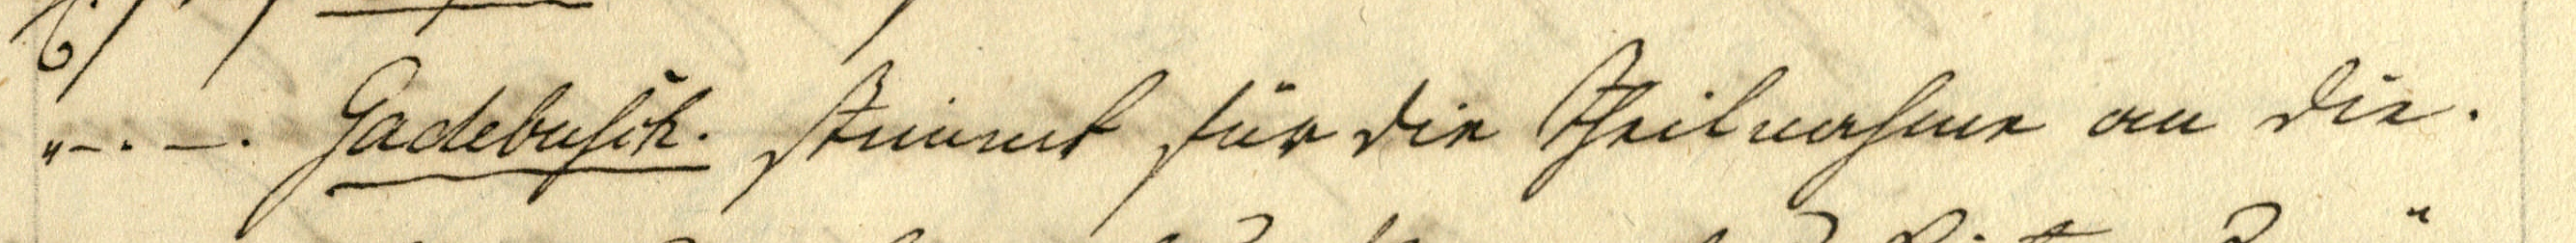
" - " - " Gadebusch. stimmt für die Theilnahme an die-
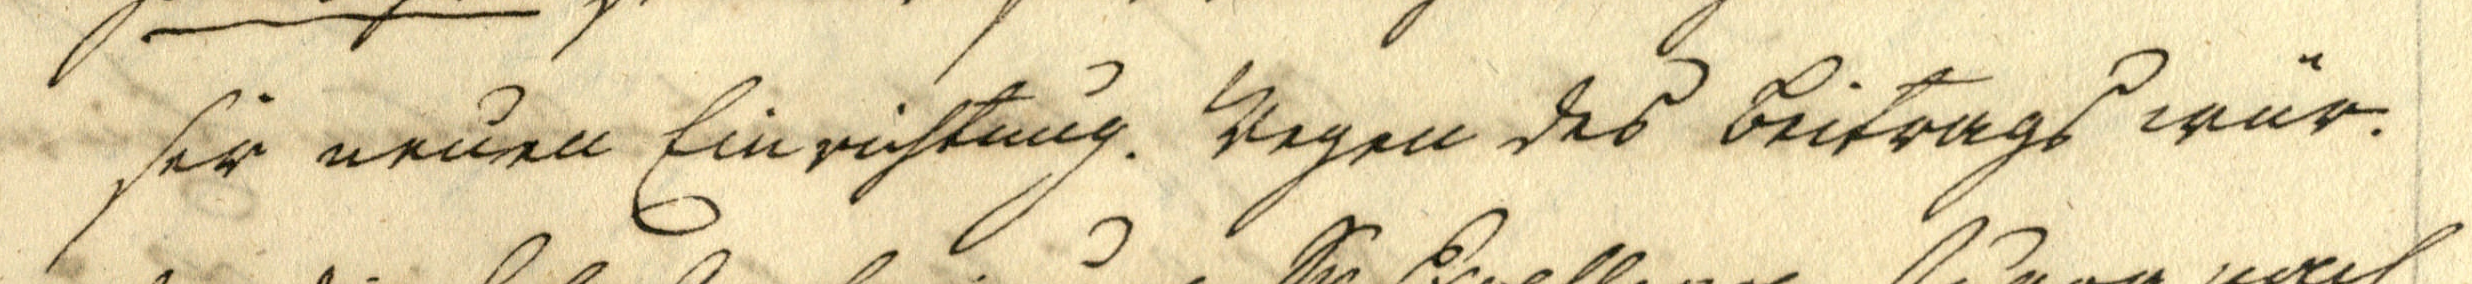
ser neuen Einrichtung. Wegen des Beitrags wür-
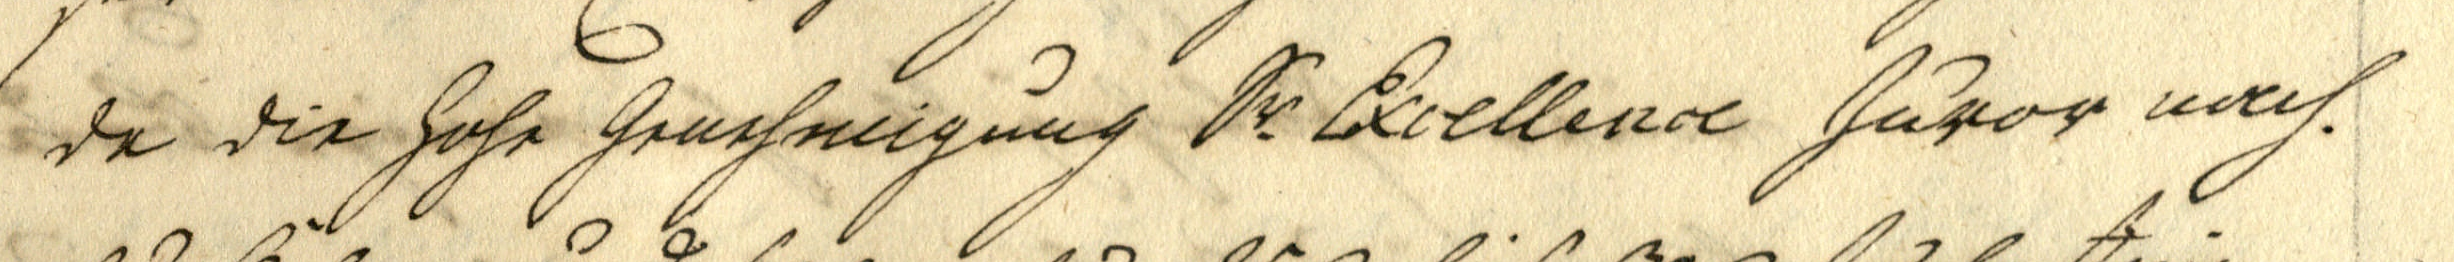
de die hohe Genehmigung Sr. Excellence zuvor nach-
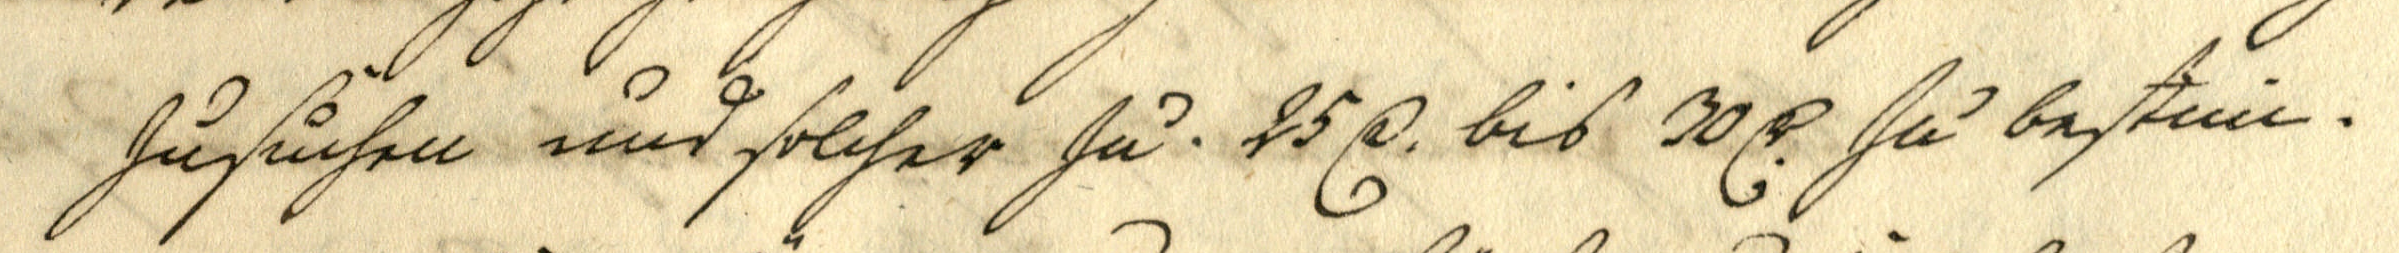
zusuchen und solcher zu 25 rtl bis 30 rtl zu bestim-
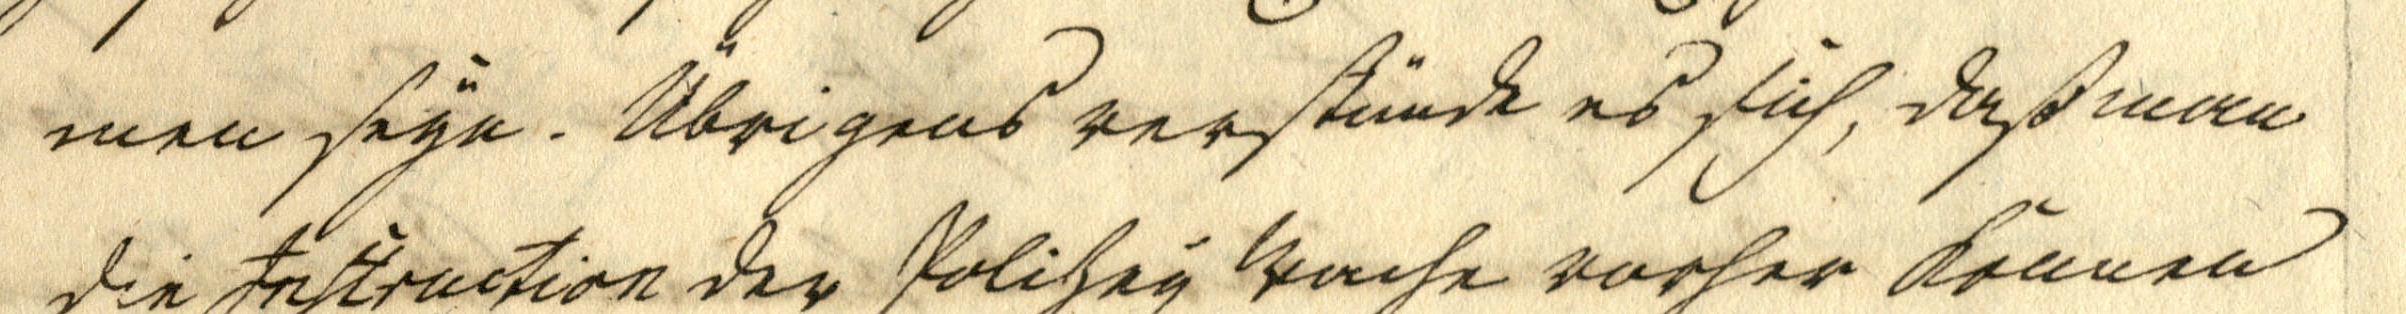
men seyn. Übrigens verstünde es sich, daß man
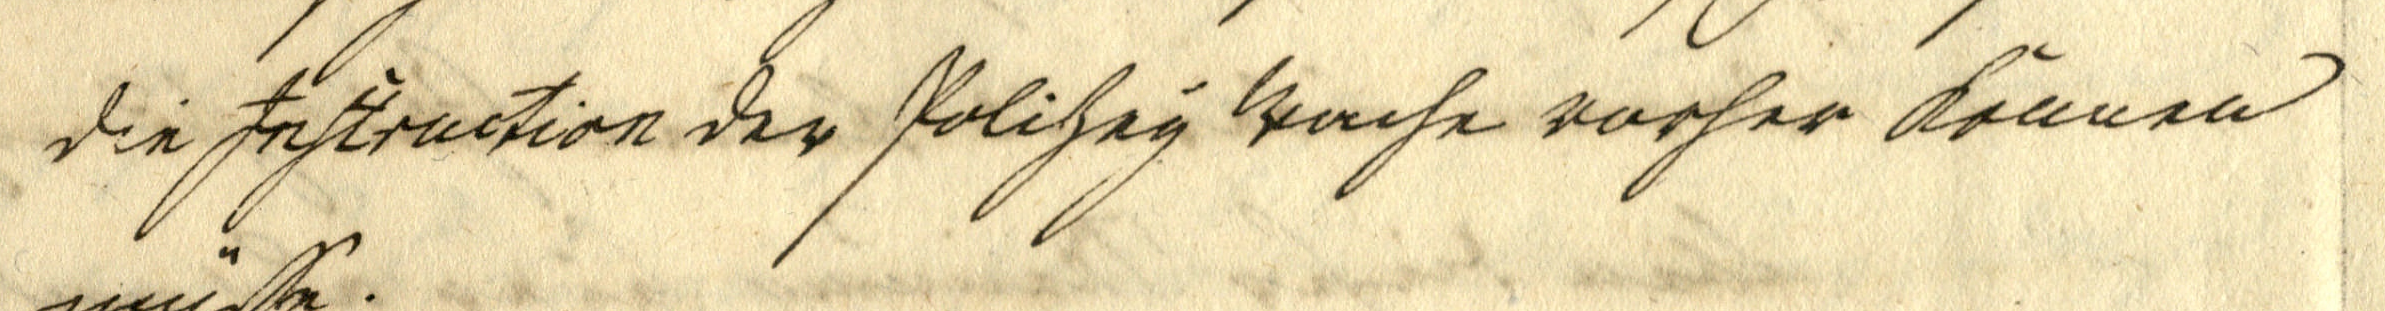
die Instruction der Polizey Wache vorher kennen
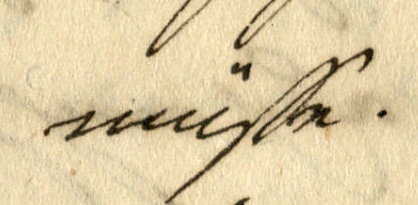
müsse.
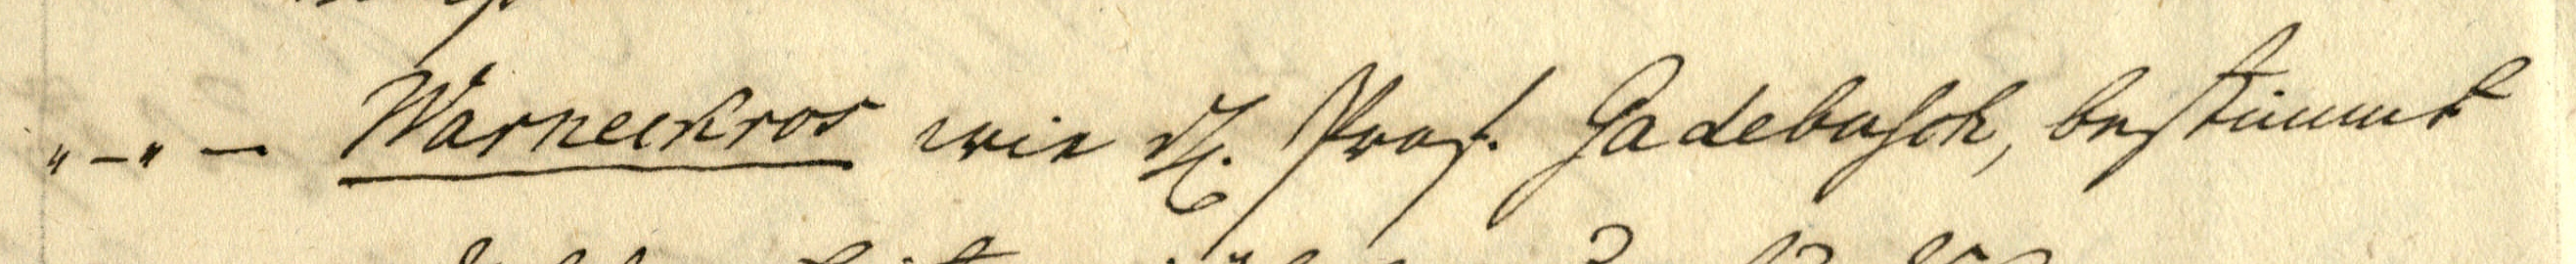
" - " - Warneckros wie dh. Porf. Gadebusch, bestimmt
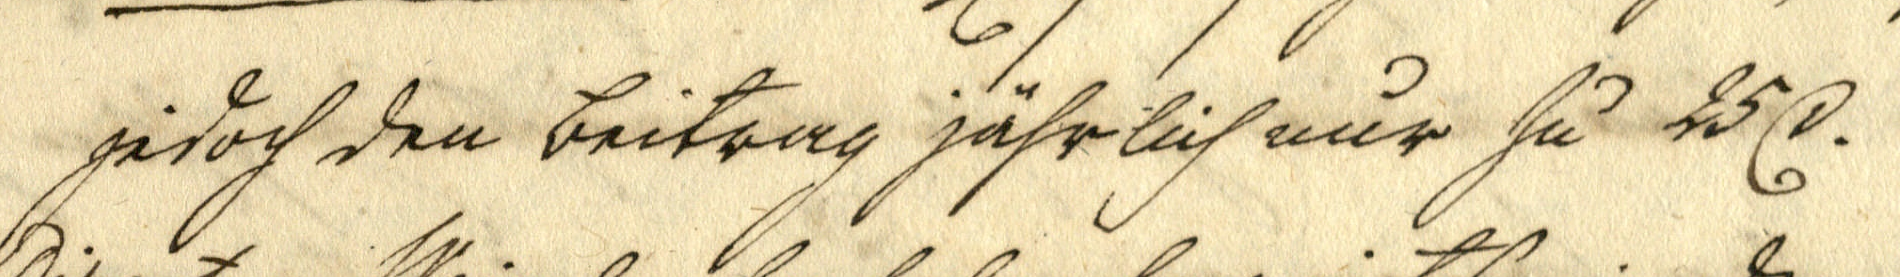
jedoch den Beitrag jährlich nur zu 25 rtl.
